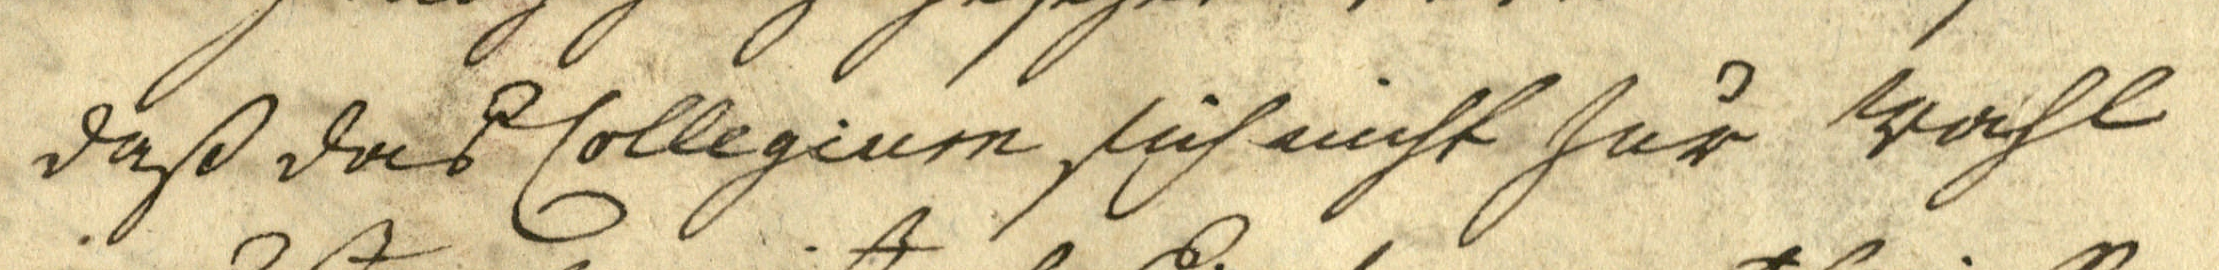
daß das Collegium sich nicht zur Wahl
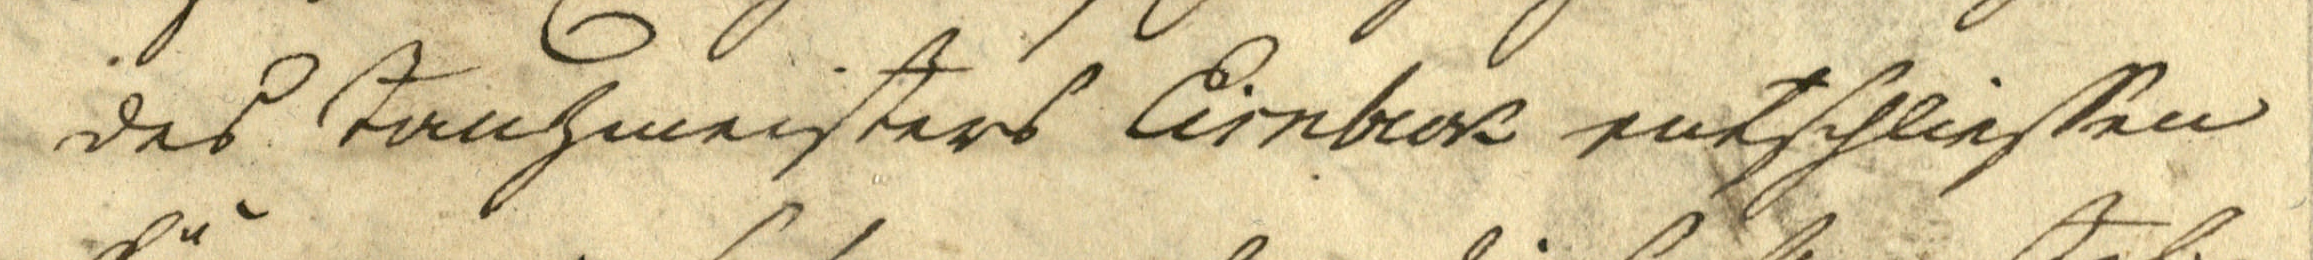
des Tanzmeisters Eimbeck entschliessen
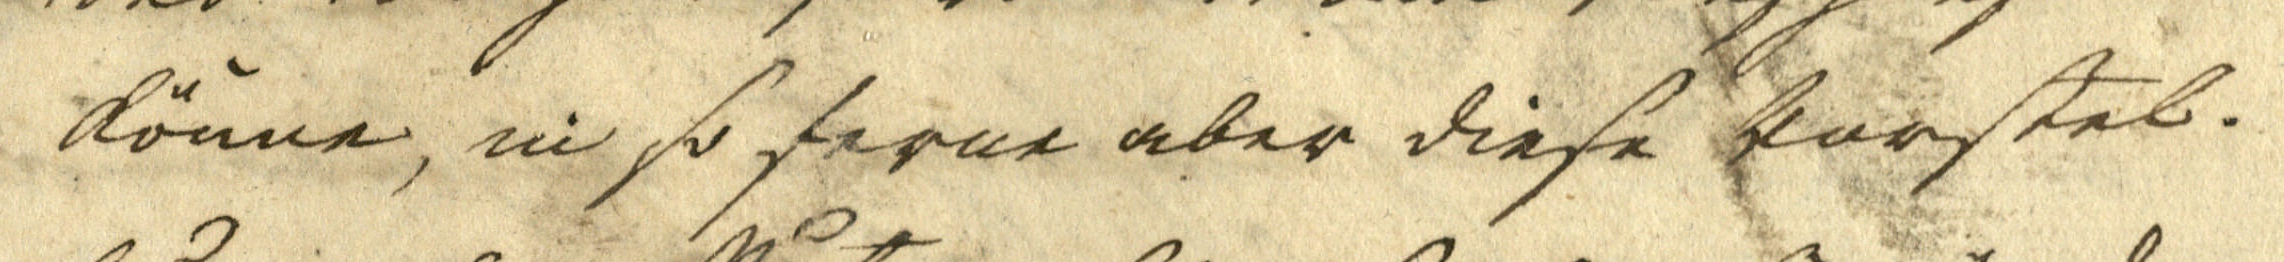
könne, in so ferne aber diese Vorstel¬
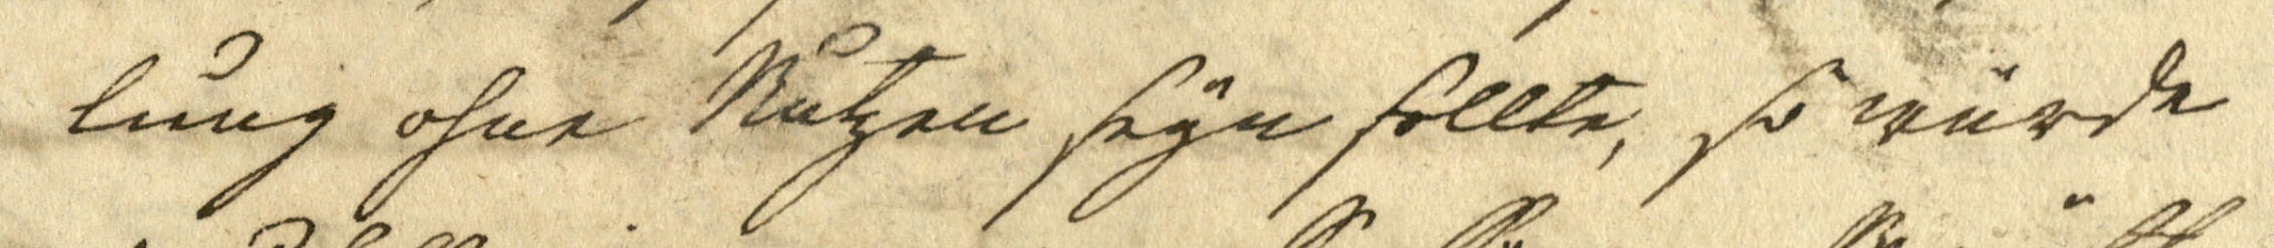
lung ohne Nutzen seyn sollte, so würde
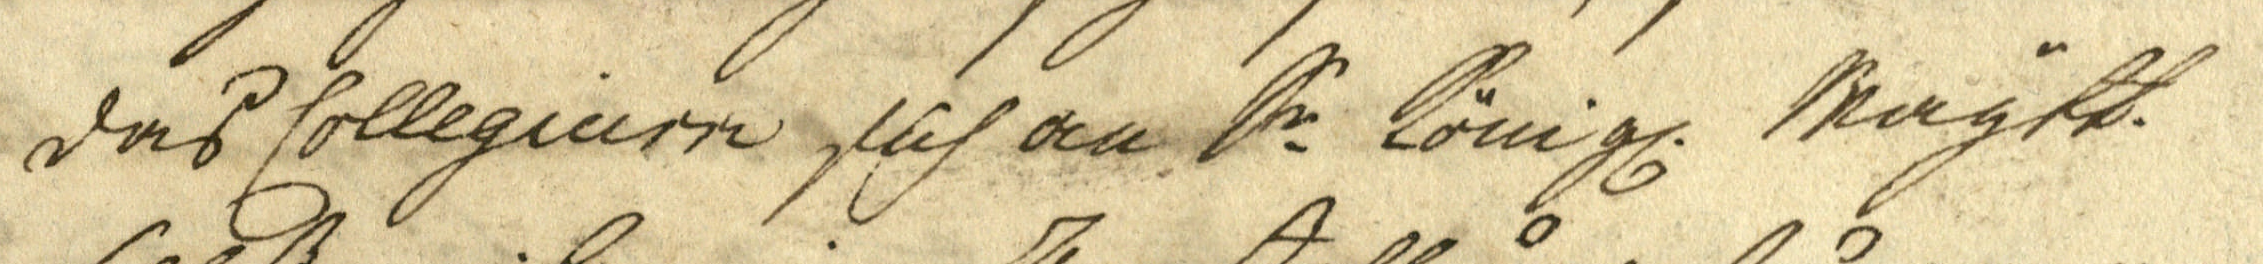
das Collegium sich an Sr Königl. Maÿtt.
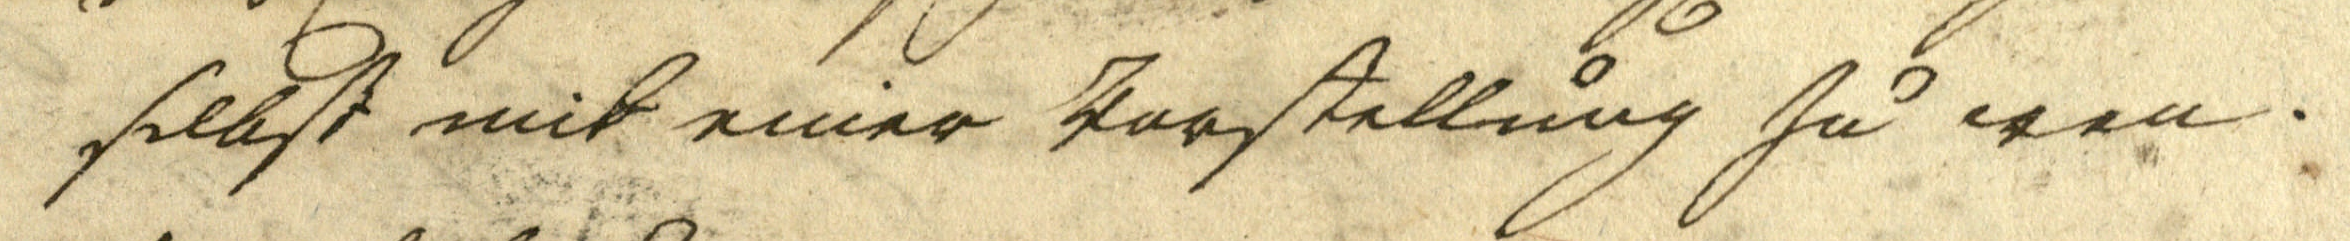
selbst mit einer Vorstellung zu wen¬
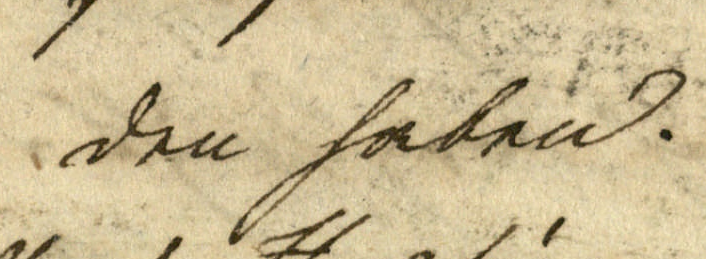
den haben.
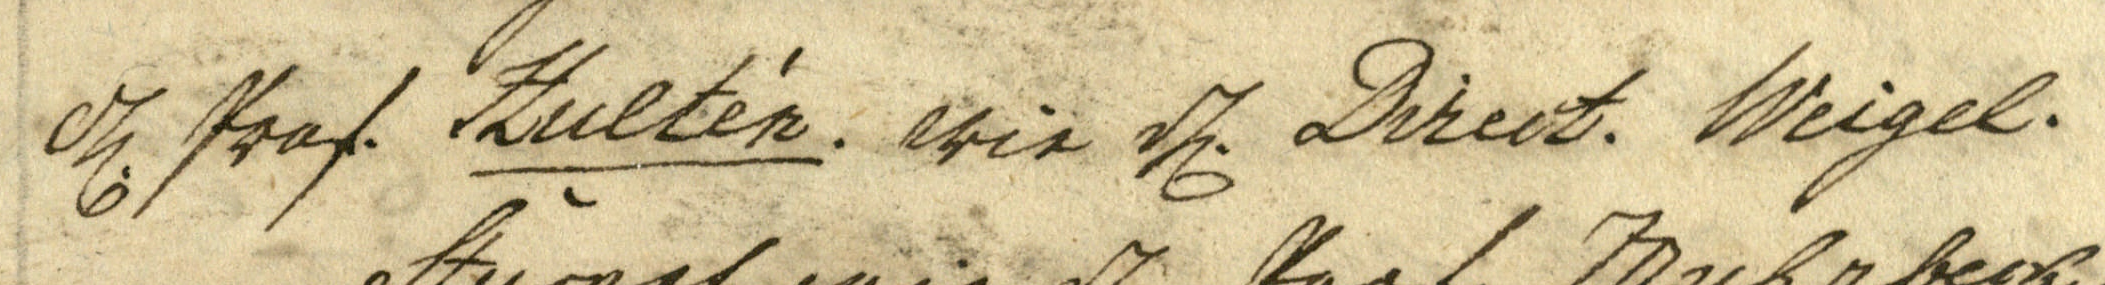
dh. Prof. Hultén. wie dh. Direct. Weigel.
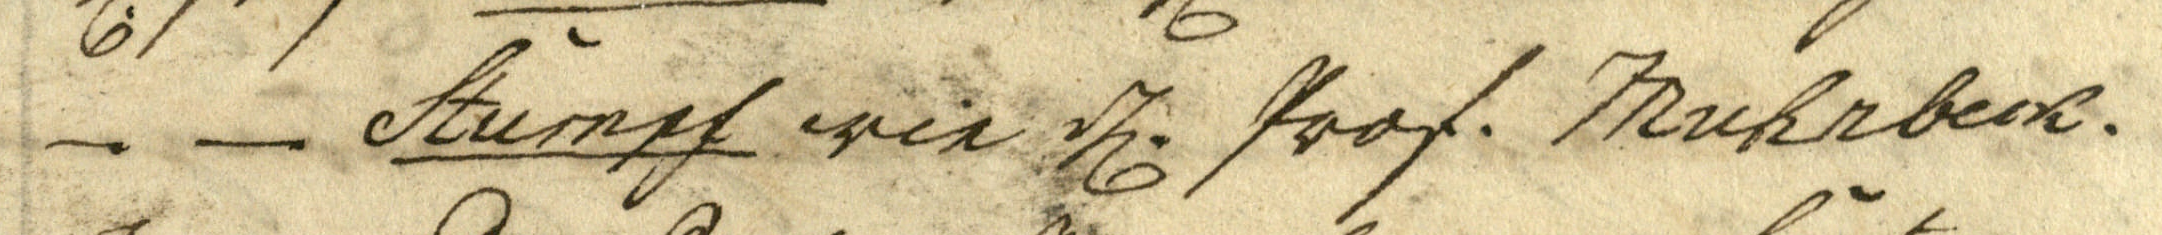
Stumpf wie dh. Prof. Muhrbeck.
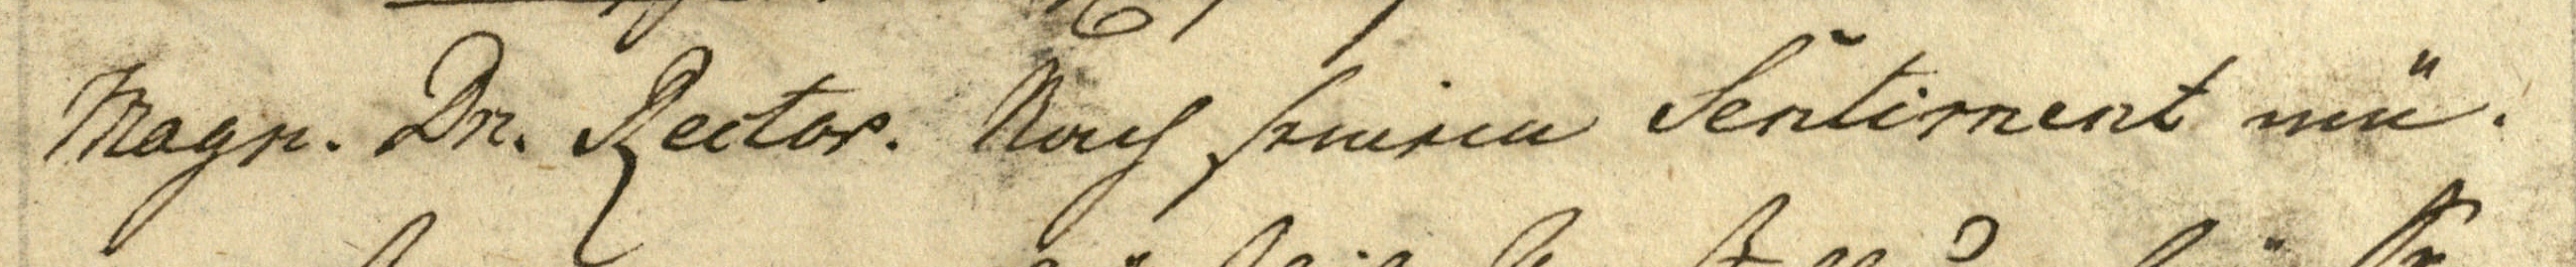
Magn. Dn. Rector. Nach seinem Sentiment mü¬
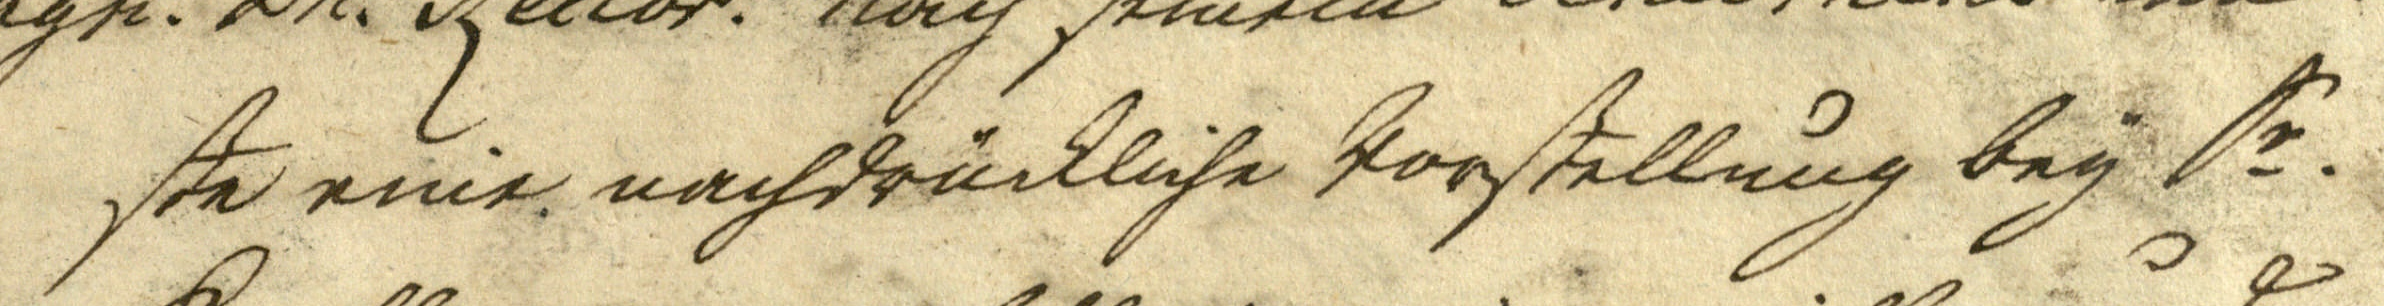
ste eine nachdrückliche Vorstellung beÿ Sr
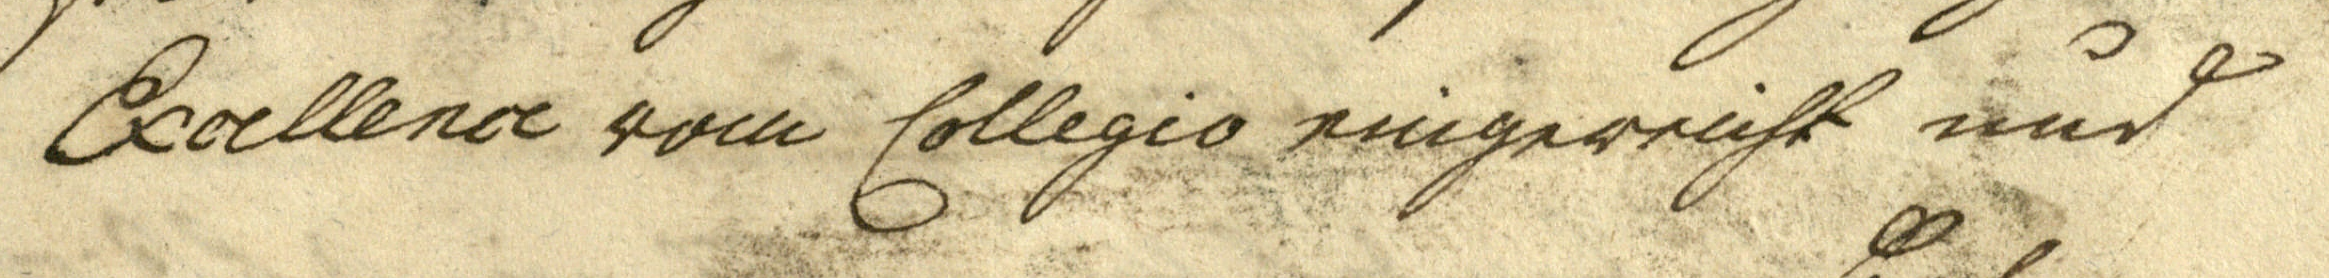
Excellence vom Collegio eingereicht und
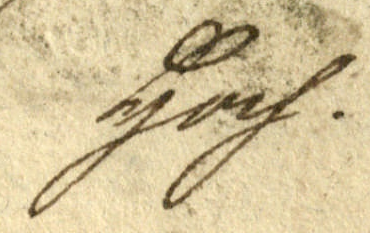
Hoch-
